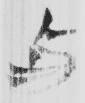此
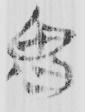胃
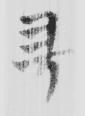𡵂
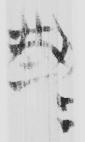型=
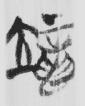{立竜}
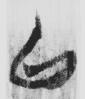㠯（以）
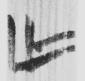亡
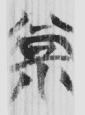常
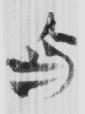此
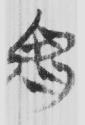胃
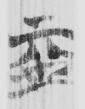亞
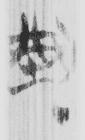型
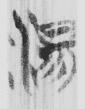湯
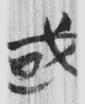或
